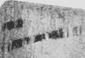二
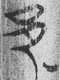邑
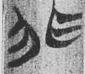非
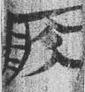疾
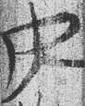𡚦（焉）
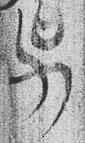加
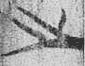之
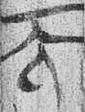而
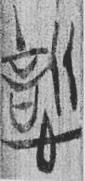○（殄）
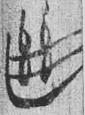○（絕）
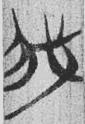我
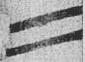二
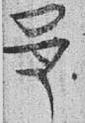邑
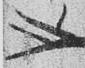之
